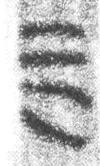而
